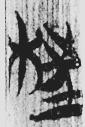○（枉）
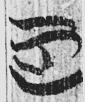正
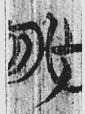我
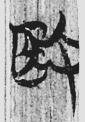○（殹）
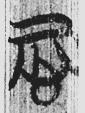○（忌）
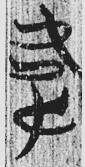韋（諱）
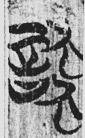○（讒）
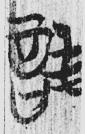○（愬）
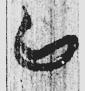㠯（以）
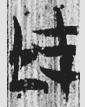○（墮）
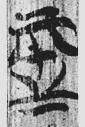亞（惡）
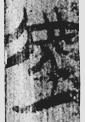○（吾）
